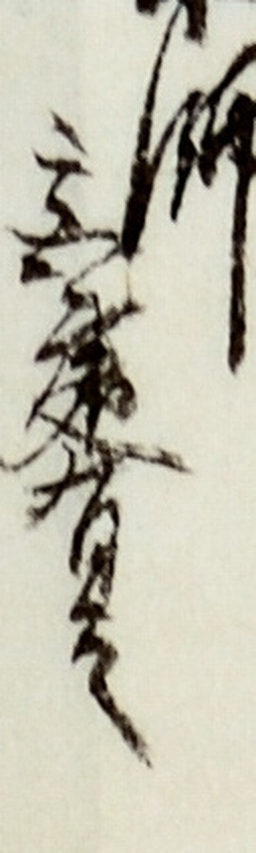宮建有之
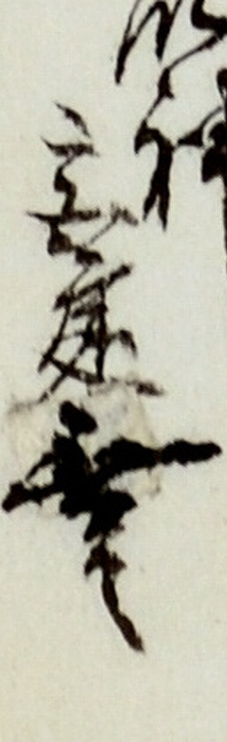宮建無之
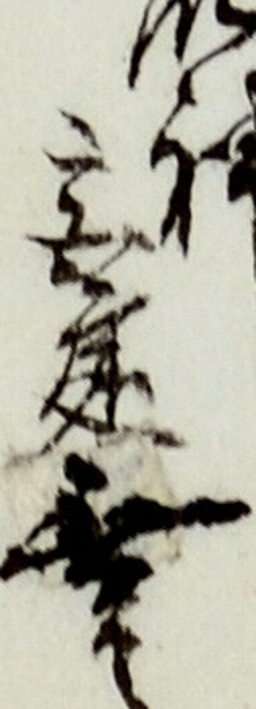宮建無之
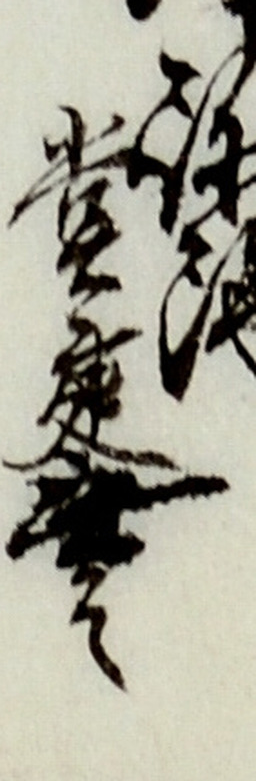堂建無之
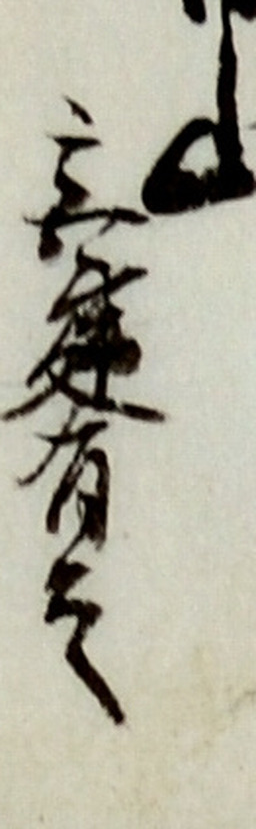宮建有之

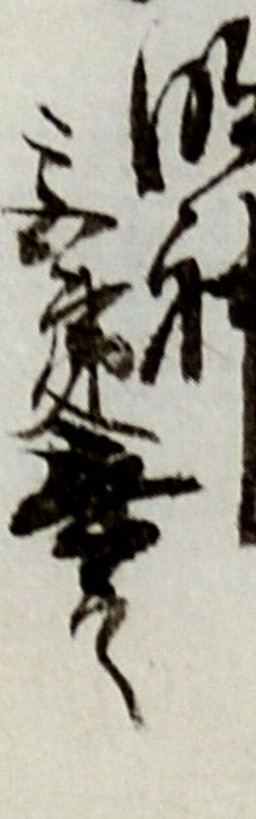宮建無之
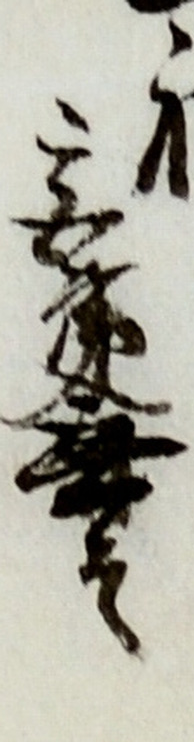宮建無之
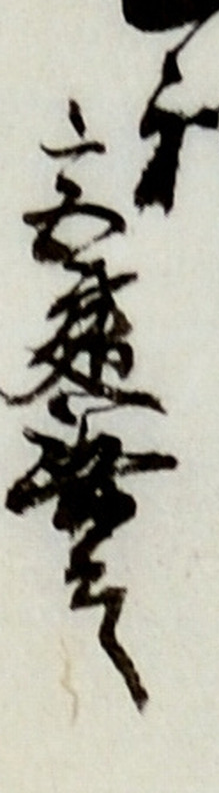宮建無之
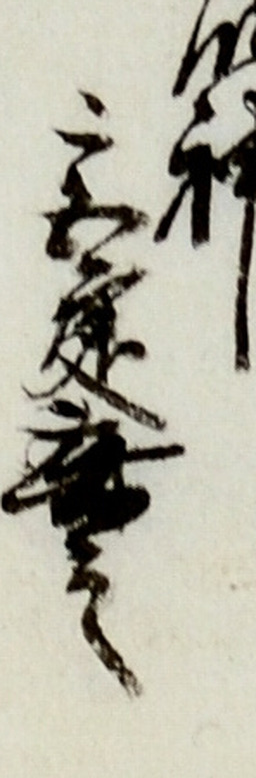宮建無之
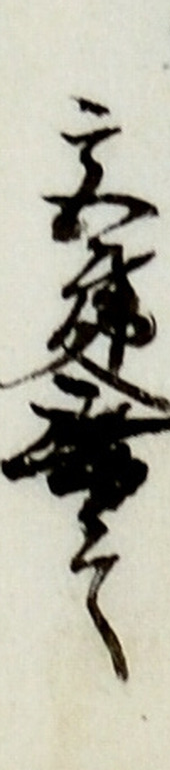宮建無之
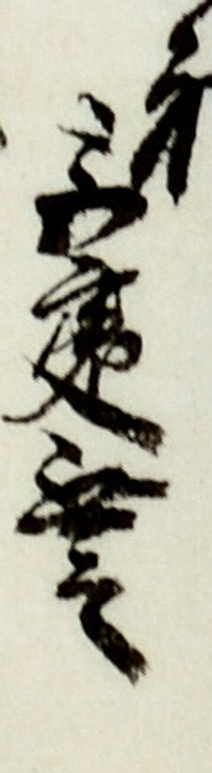宮建無之
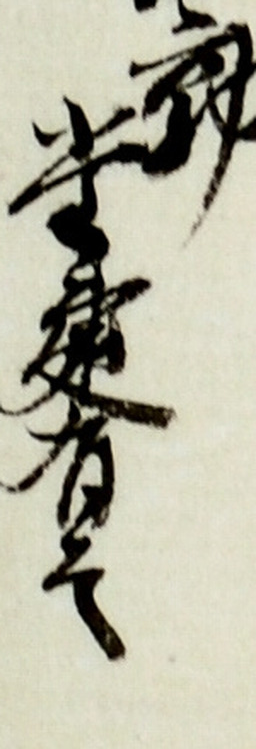堂建有之
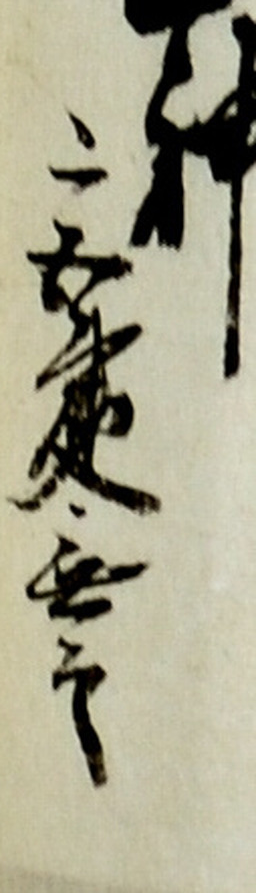宮建無之
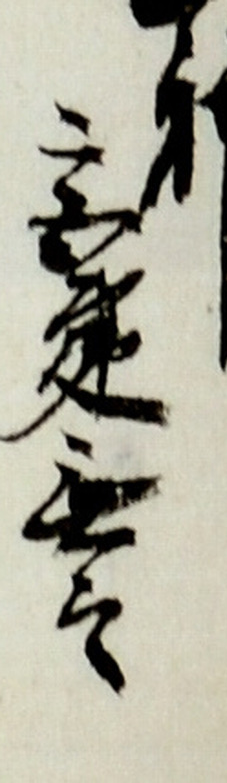宮建無之
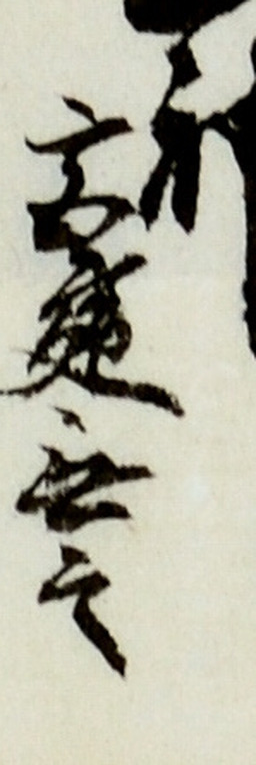宮建無之
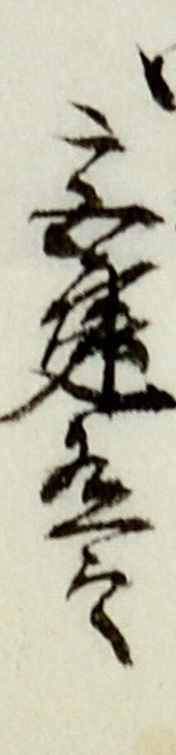宮建有之
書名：御領分中山林社地手控
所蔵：伊那市立高遠町図書館・合同会社AMANE
